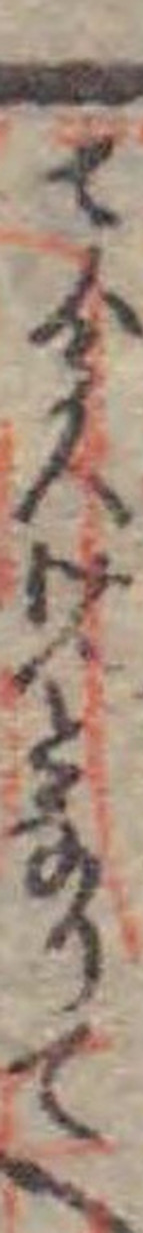て今人けんとなりて
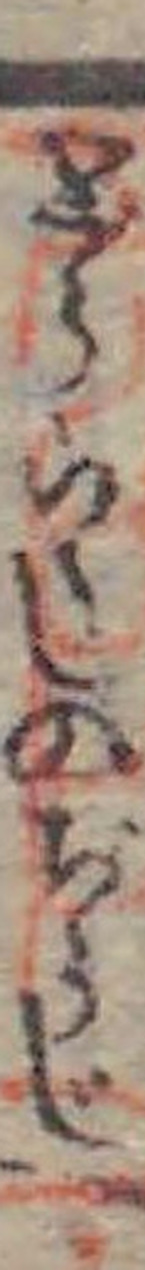とうらくしのぢうじ
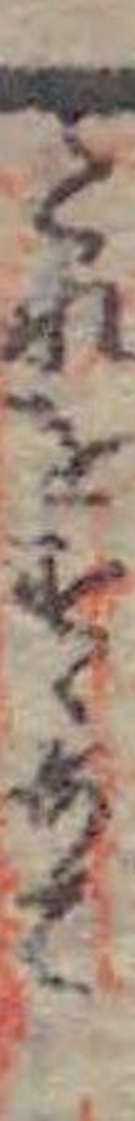これをすくあて
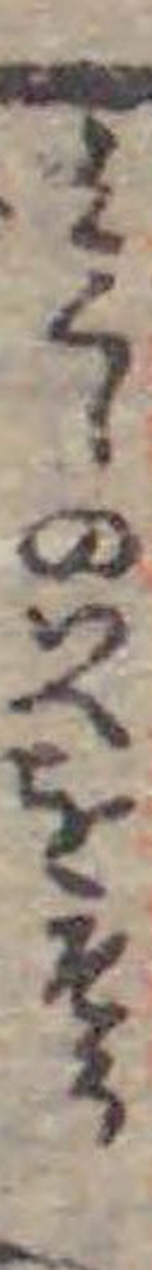みこしのいへをそう
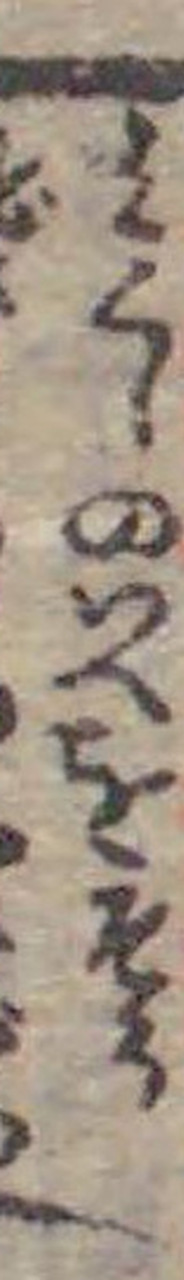みこしのいへをそう
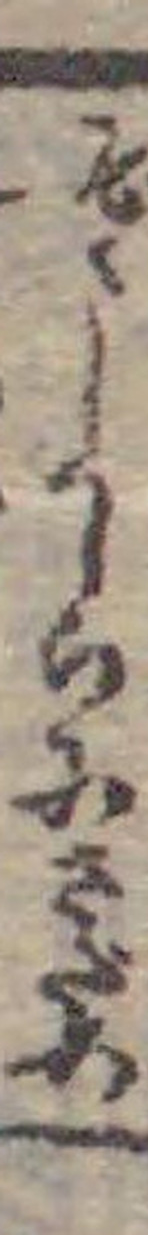ぞくしてらにさだめ
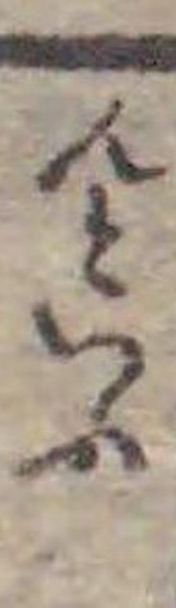んといふ

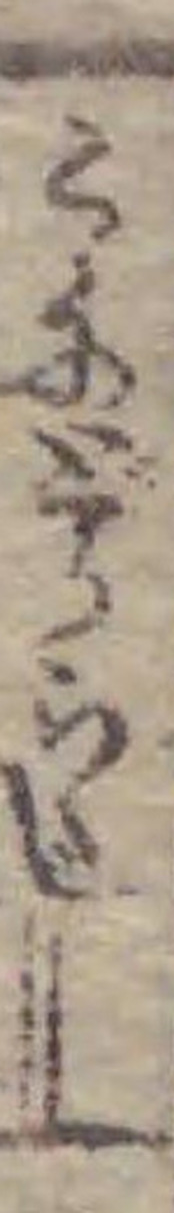こゝにどうらくじ
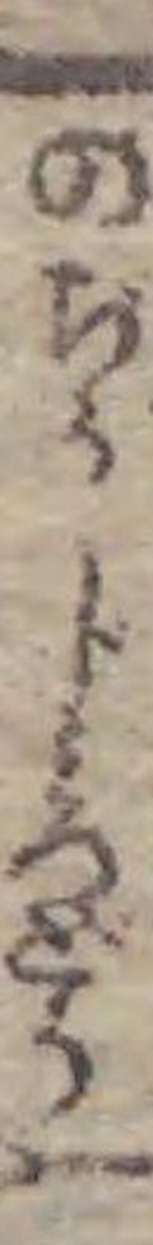のぢうじみつどう
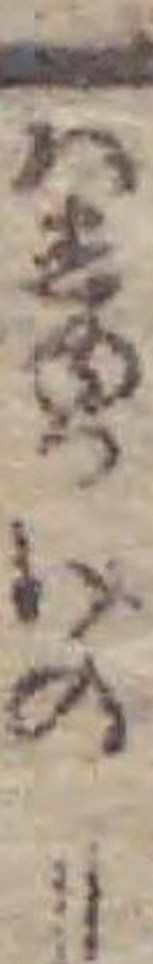はしゆつけの
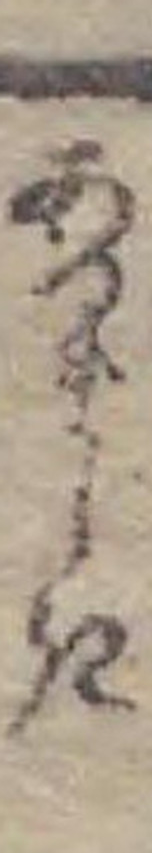あるましき
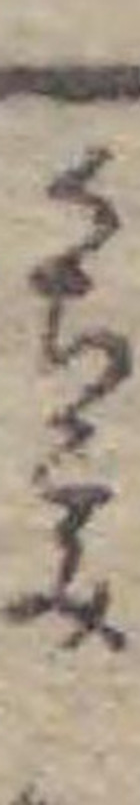うちこみ
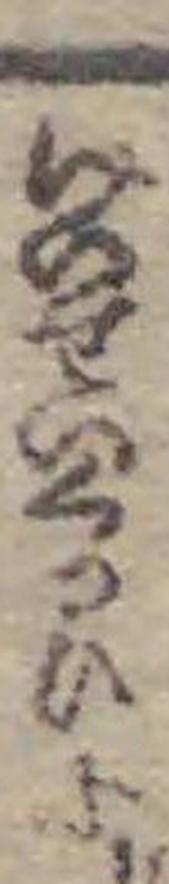けいせいくるひに
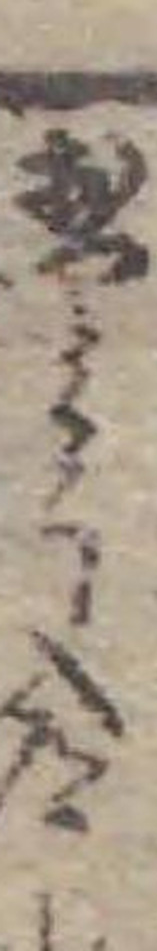おやみこし入道
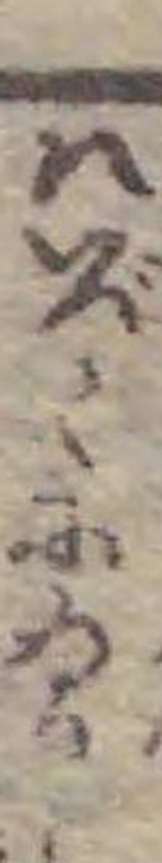はいづこにゐる
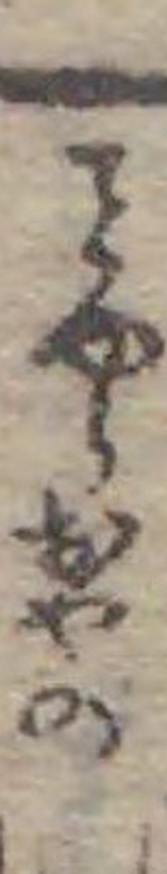ことやらおやの
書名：[化物一代記] : 5巻
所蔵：国立国会図書館 National Diet Library, JAPAN
